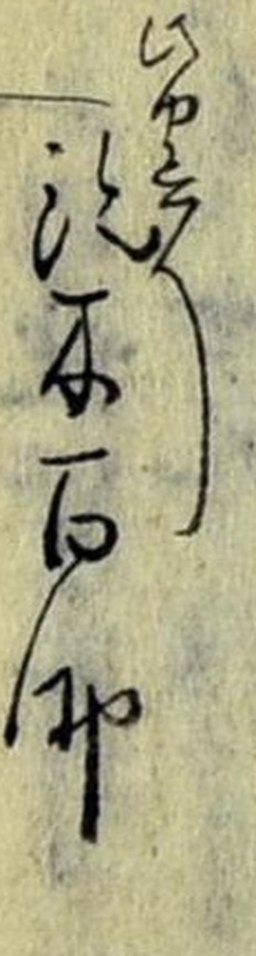鈴木百助

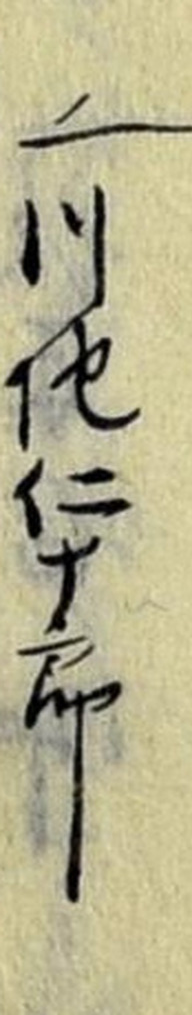川地仁十郎
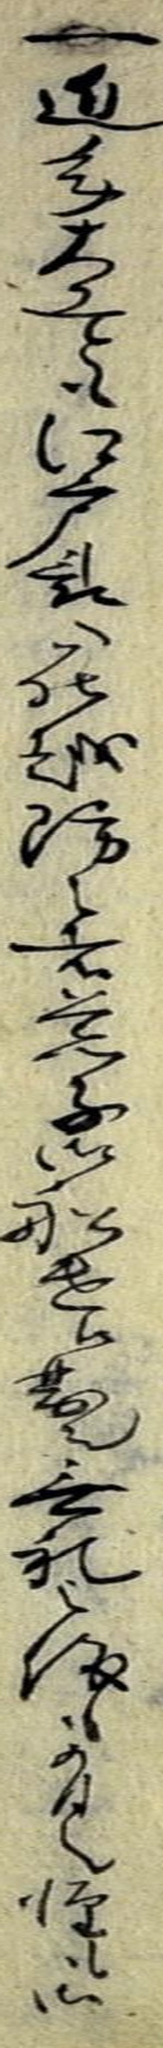一近年大工とも江戸表へ罷越防之者荒子御船遣江対シ無礼之儀も有之軽も御
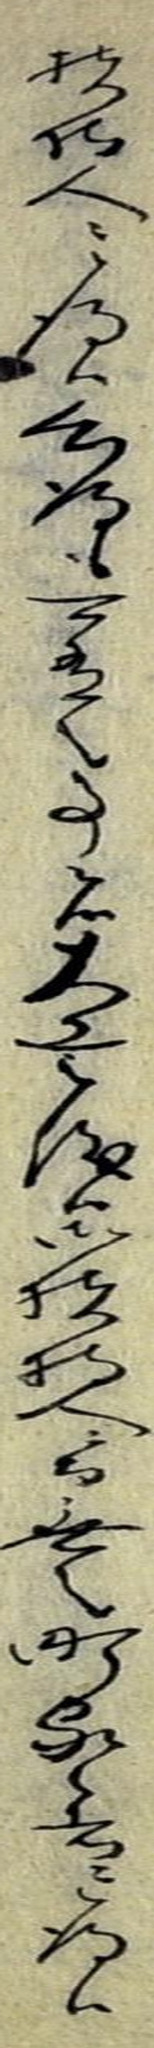指物人ニ候得ハ心得も可有之事ニ候大工之儀ハ御指物人ニ而無之町家之者
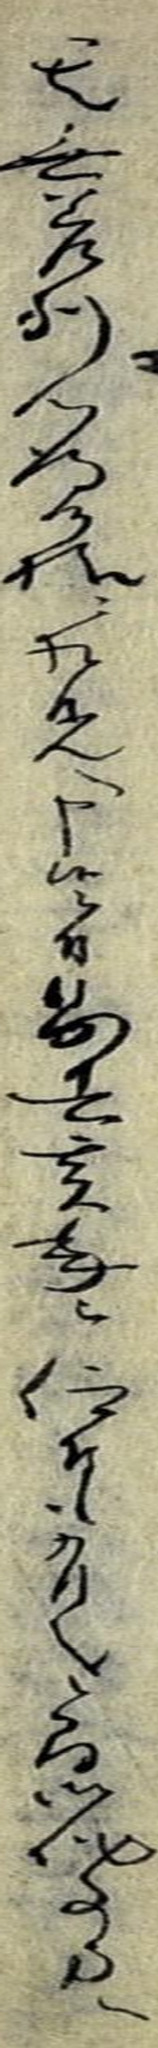其無差別心得候様ニ相見へ申候ニ付則去亥年被仰付も有之候間御作事方へ
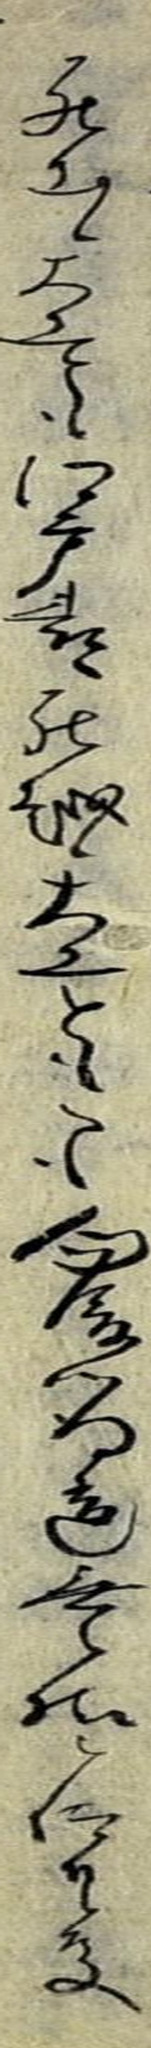罷出候大工とも江戸表へ罷越候大工ともへも向後心得違無之様被仰付候事
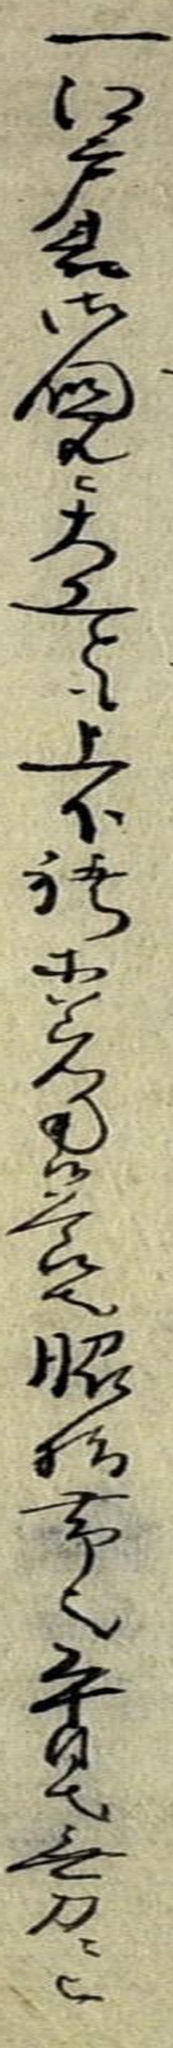一江戸表御国共ニ大工とも上下袴等着用候節者脇指帯之平日者無刀ニ被
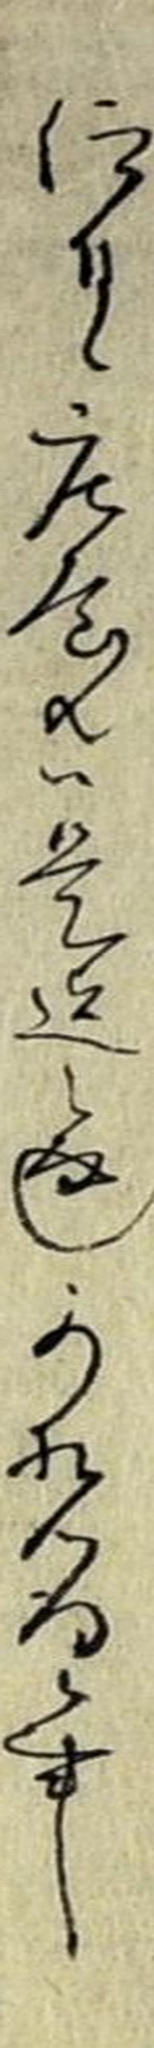仰付候庄屋共ハ是迄之通可相心得候事
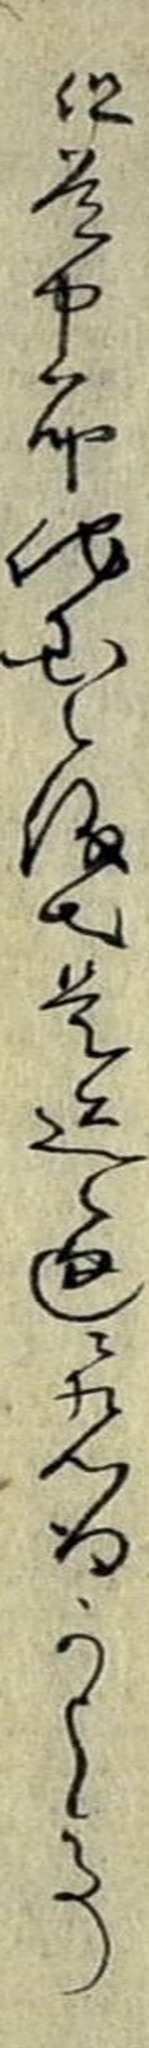但道中筋他国之儀者是迄之通ニ相心得可申候事
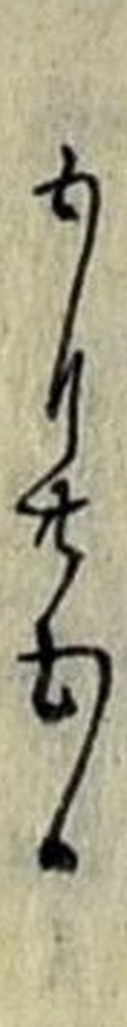五月廿五日
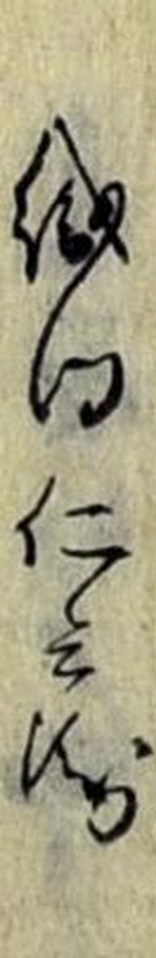織田仁兵衛
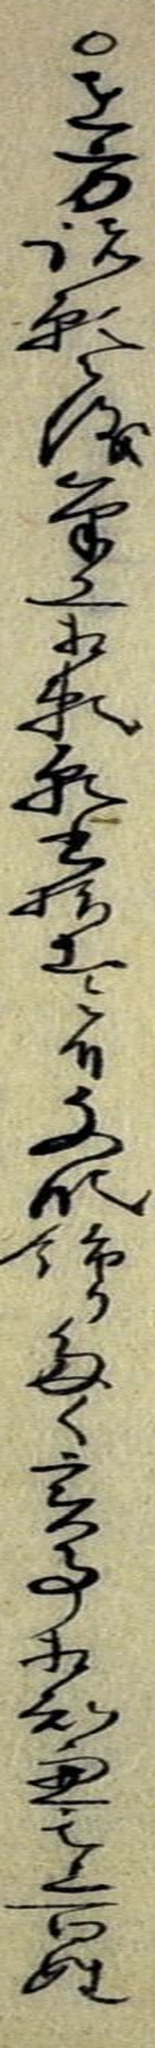〇在方諸願之儀筆工相頼願書指出候ニ付文段飾り多く実事相知兼其上百姓
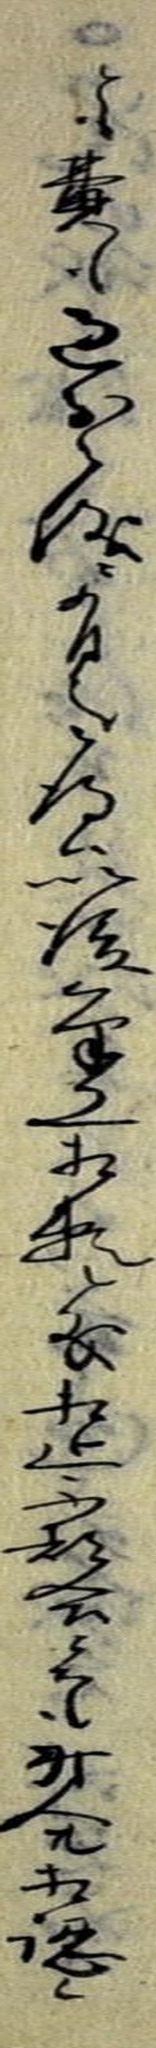とも費も過分之儀ニ有之候得ハ以後筆工相頼候義相止不都合ニ而も村人共相認候
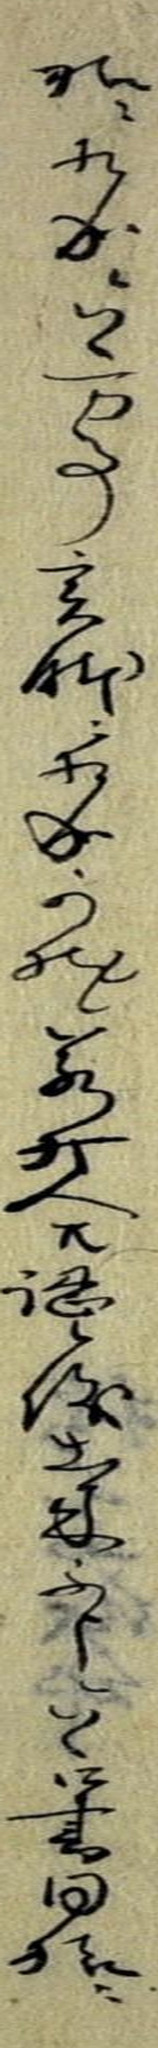様ニ相成候ハヽ万事実体ニ相成可然候若村人共認候儀出来不申候ハヽ口書同様ニ
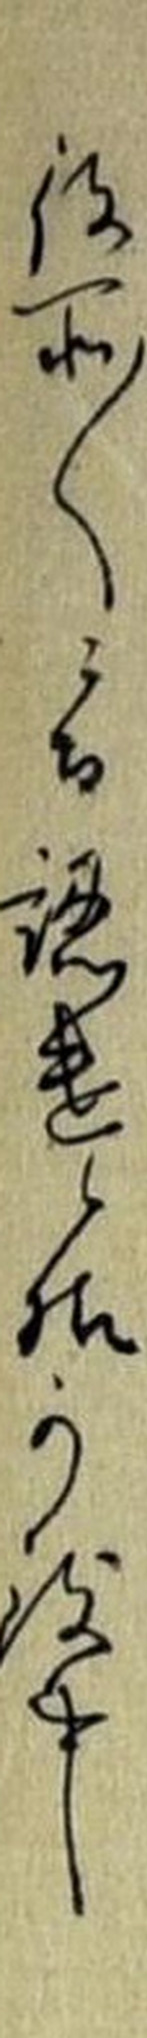役所〳〵ニ而認遣候様可致事
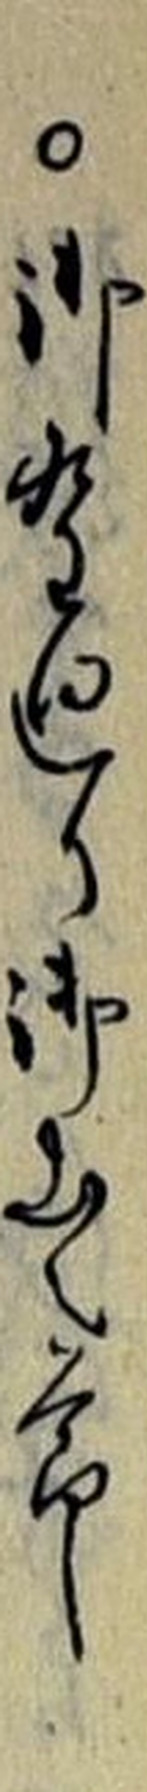〇御野廻り御出之節
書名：命令之部 三
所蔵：福井県文書館 Fukui Prefectural Archives
